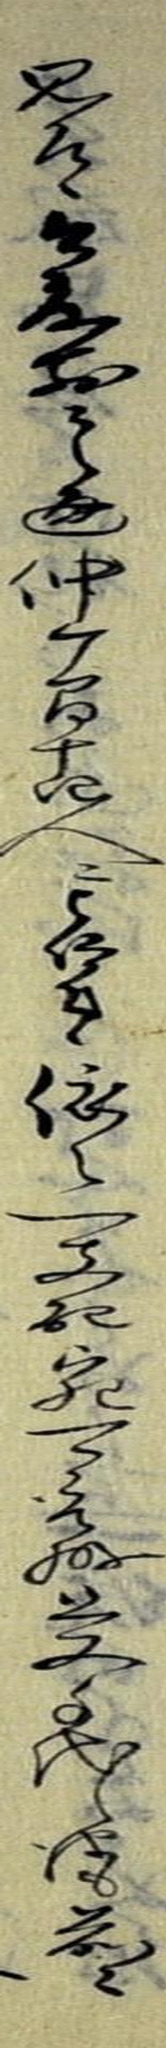思召候今度前々之通仲ヶ間十四人に被仰付候依之一支配宛可取扱且又手代之儀も前々
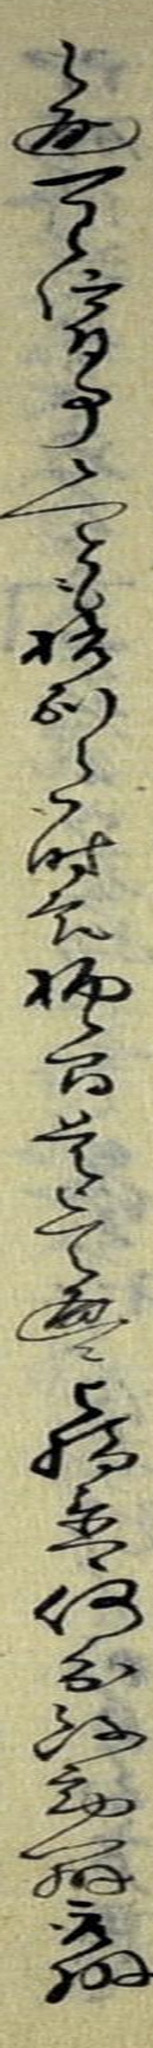之通可被仰付事候へとも格別之御時節柄候間是迄之通に被指置候何分致勘弁取扱
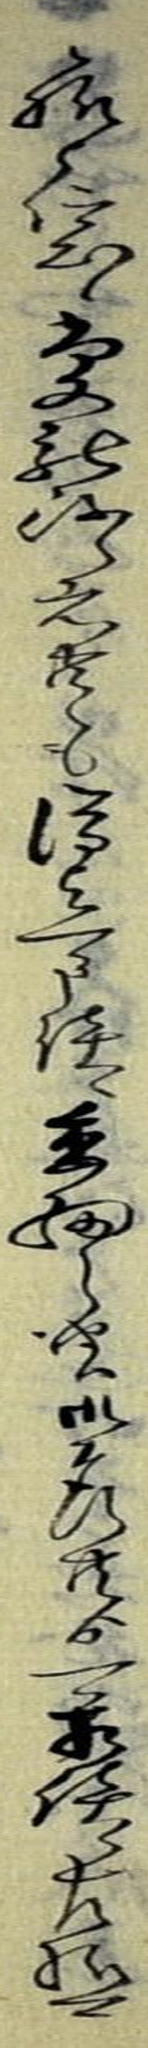候様被仰出候尚又新役之者共へも得与可申談候委細之儀は御奉行共ゟ可相談候左様可
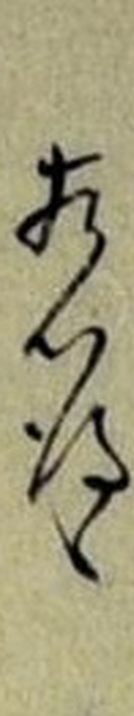相心得候
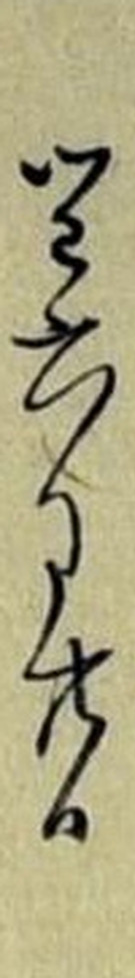閏六月廿日
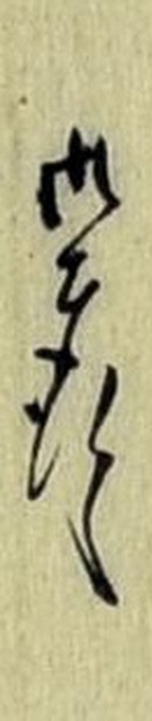御奉行へ
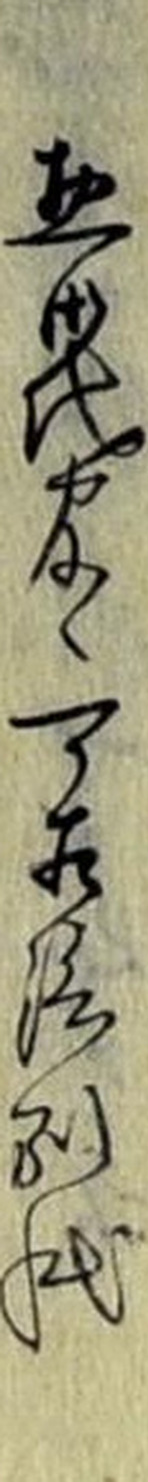惣御代官へ可相渡別紙
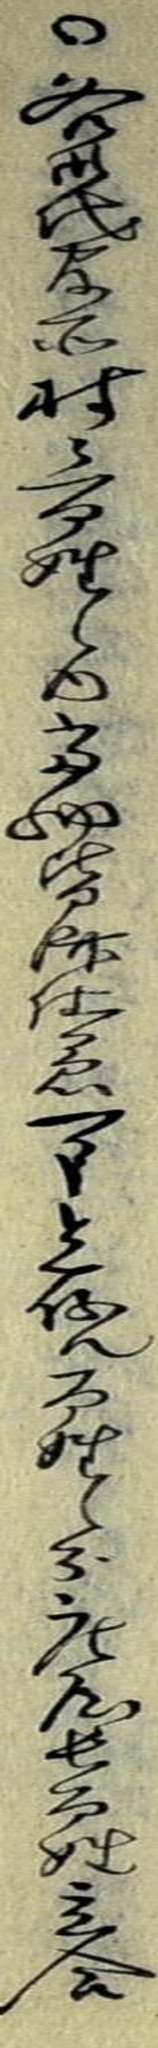〇各御代官所村々百姓之内当納皆済仕兼可申と存る百姓之分庄屋長百姓立合
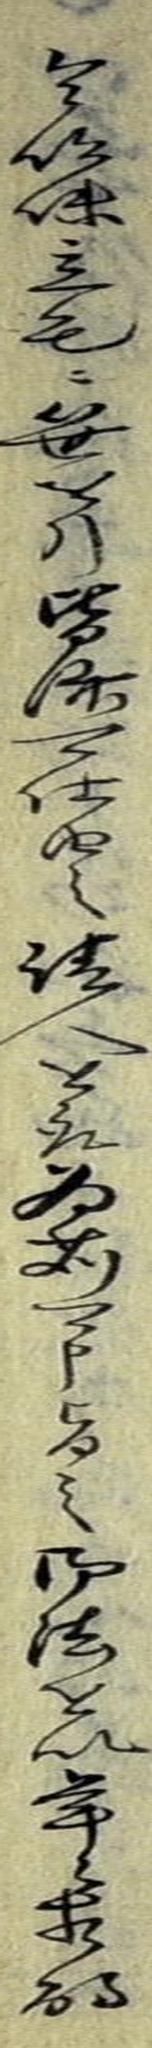令吟味立毛に笹を引皆済可仕由之請人を取為苅可申旨之御法を以年々相触
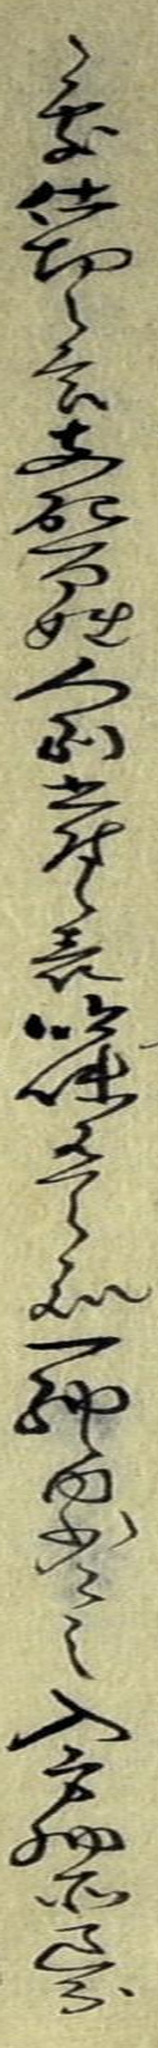候処仕切之節支配百姓人別書付之表吟味有之候処一納之内少々之入方納所過分
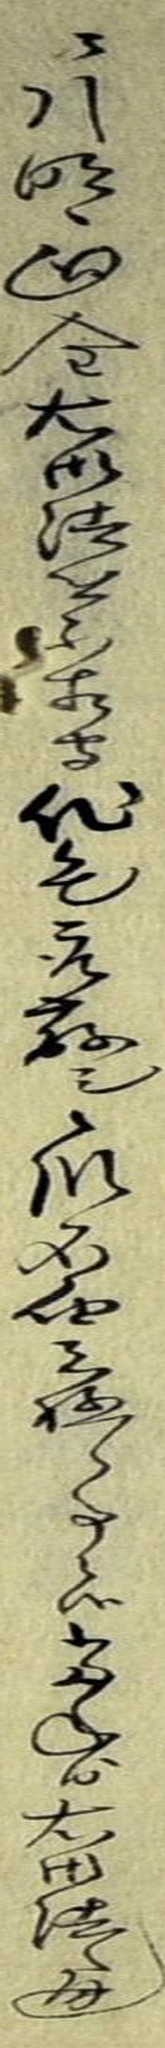に引明候趣全右御法を不相守作毛取散し候段不届至極之事に候当年ゟ右御法之通
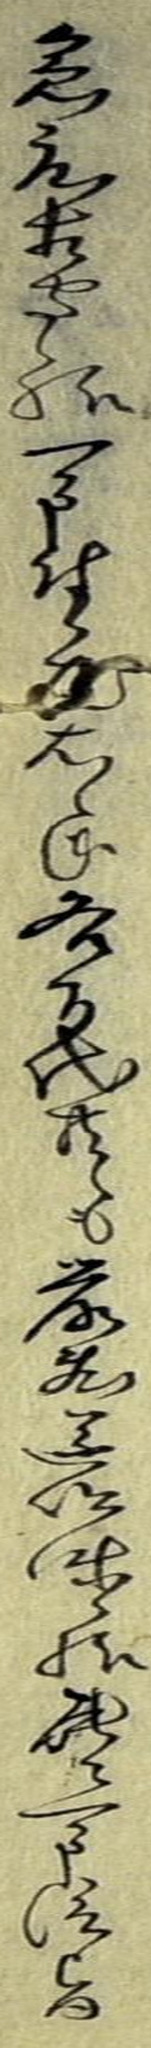急度相守候様可申付候右之趣各下代共へも厳敷遂吟味候様能々可申渡旨
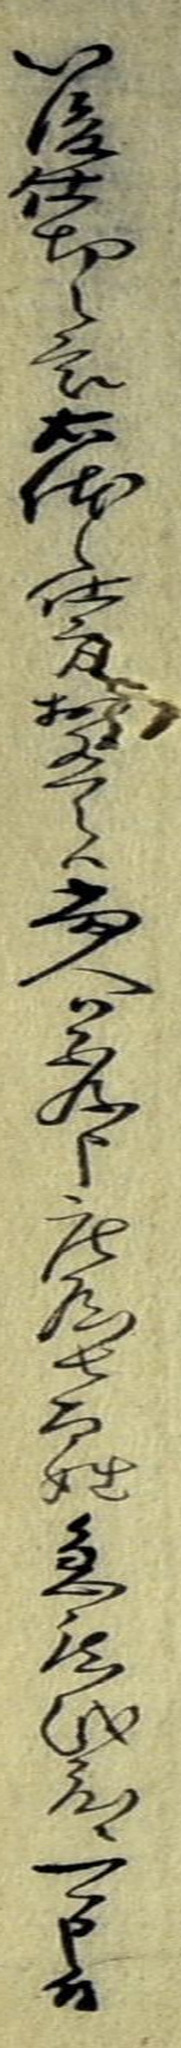以後仕切之節右体之仕方於有之は当人は不及申庄屋長百姓急度越度に可申付

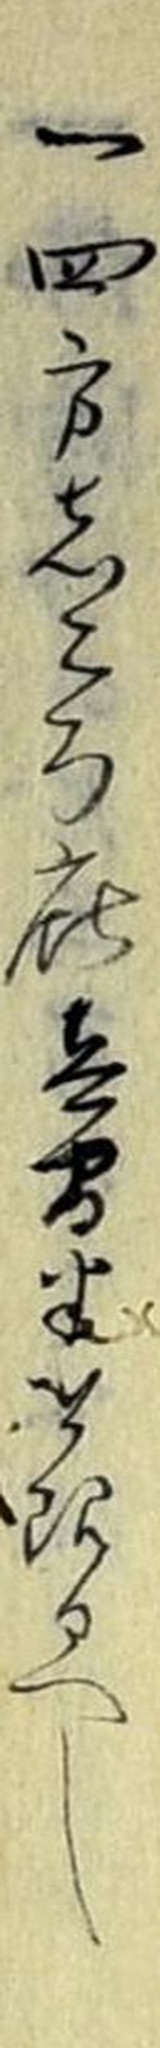一四方しころ庇壱間半を限るへし
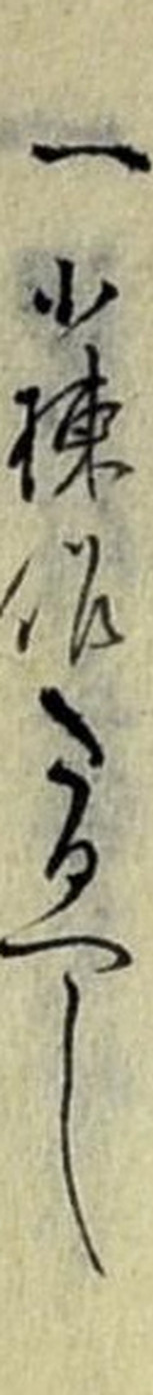一小棟作たるへし
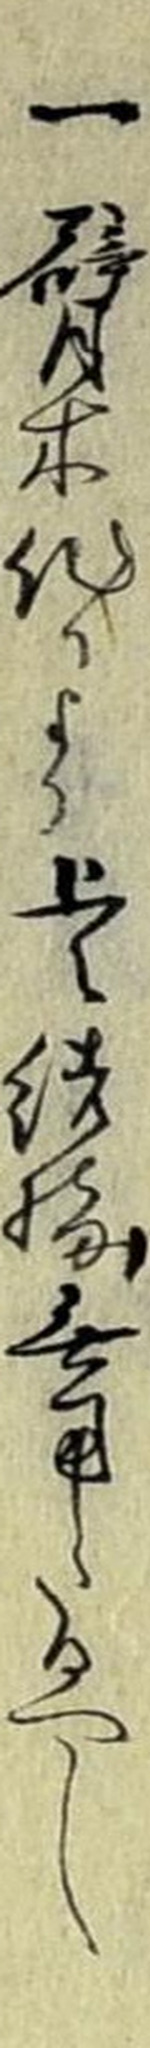一臂木作りより上之結構無用たるへし
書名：命令之部 二
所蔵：福井県文書館 Fukui Prefectural Archives
